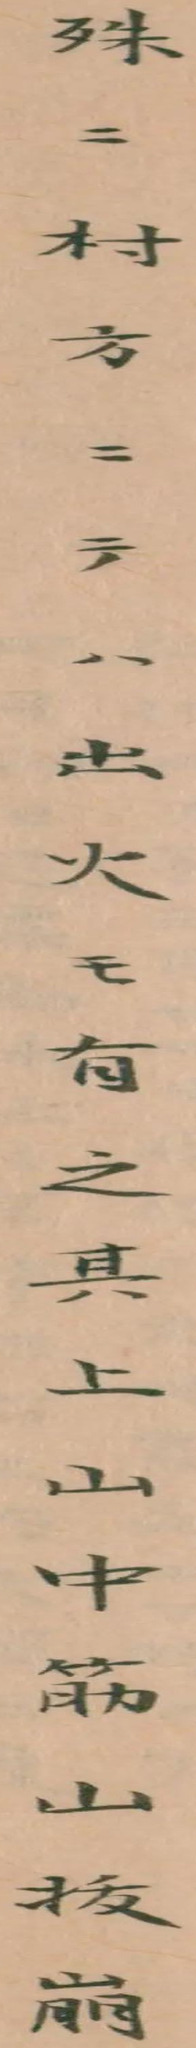殊二村方二テハ出火モ有之其上山中筋山抜崩
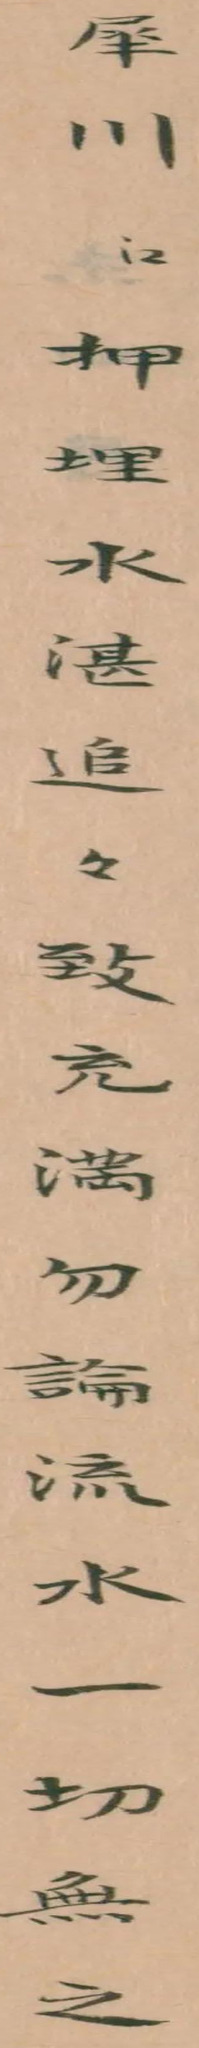犀川江押埋水湛追々致充満勿論流水一切無之
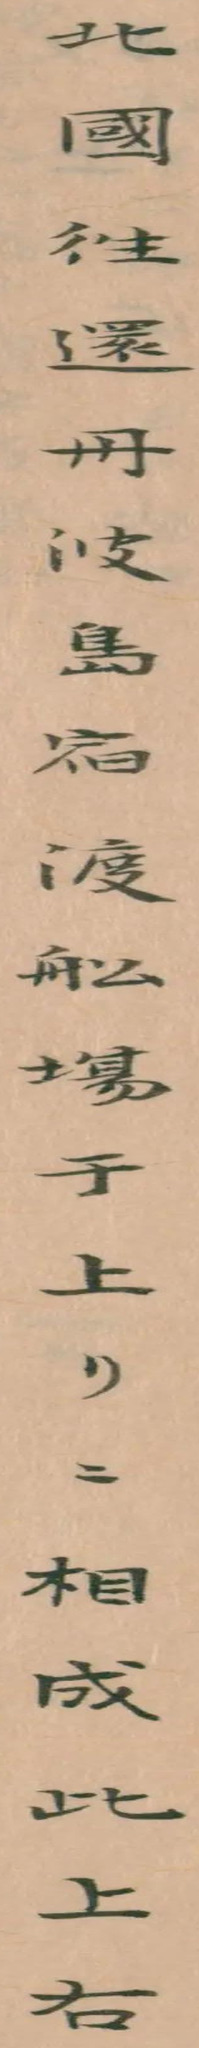北国往還丹波島宿渡船場干上り二相成此上右
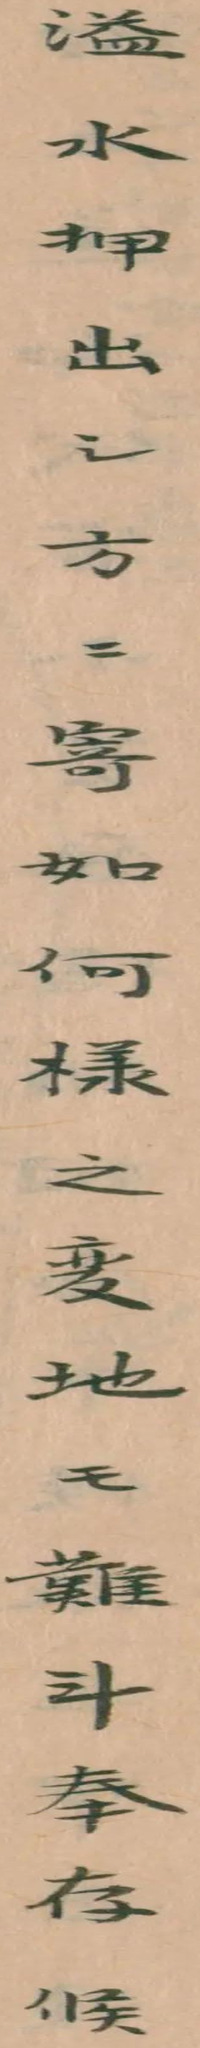溢水押出シ方二寄如何様之変地モ難斗奉存候
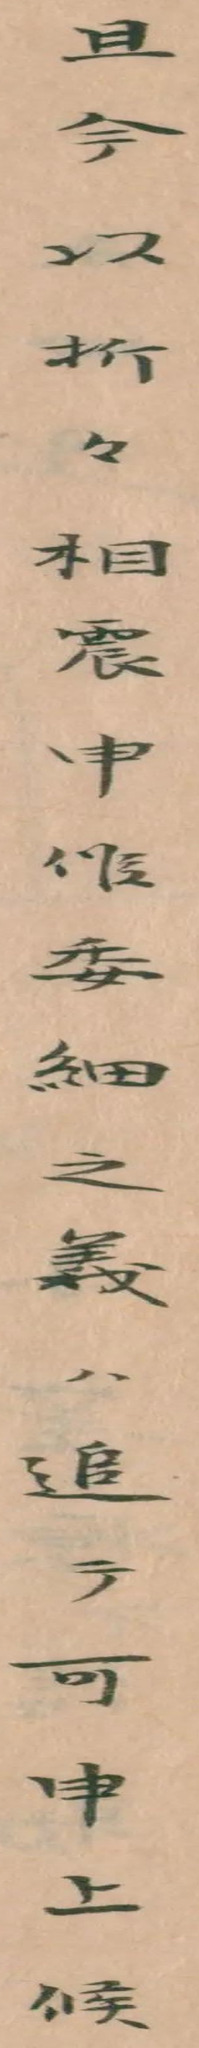且今以折々相震申候委細之義ハ追テ可申上候
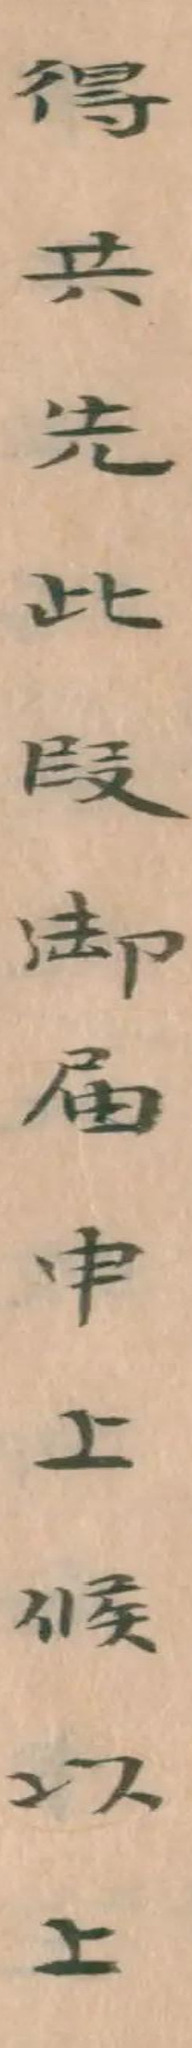得共先此段御届申上候以上
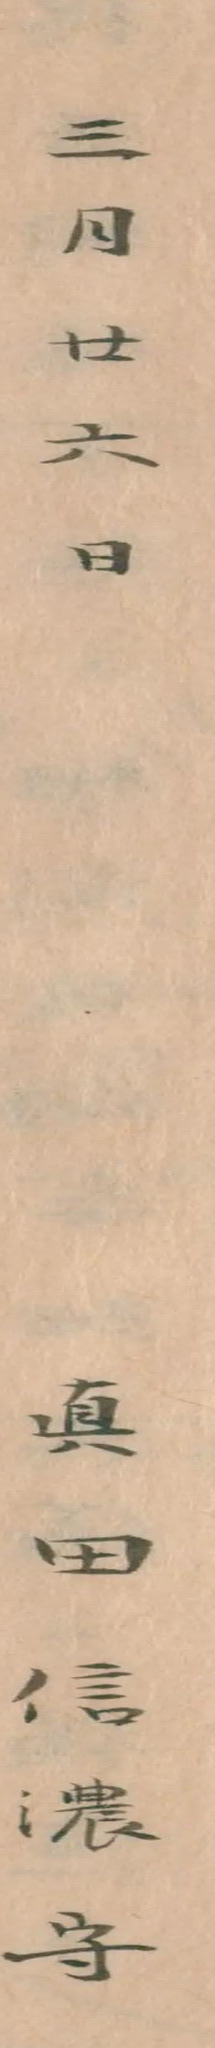三月廿六日真田信濃守
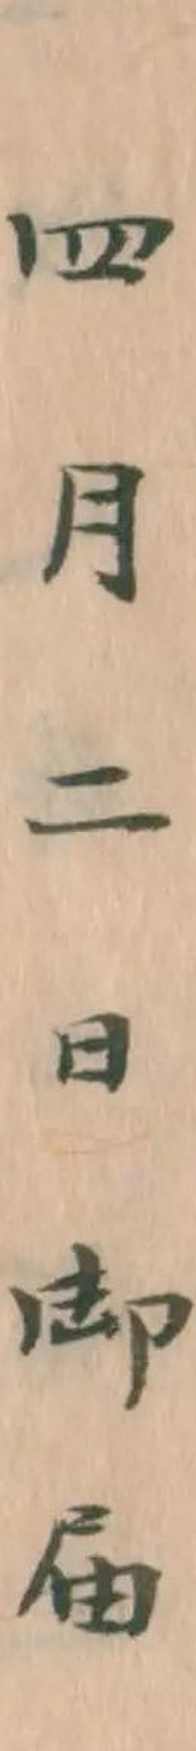四月二日御届
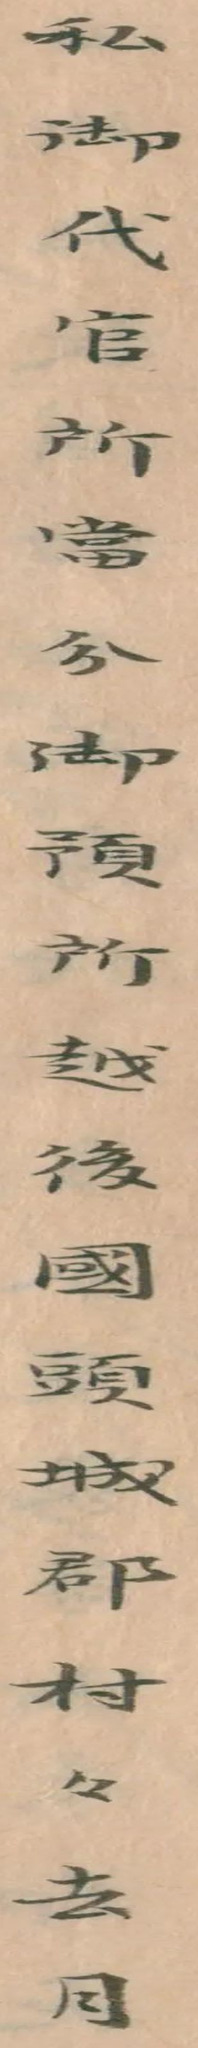私御代官所当分御預所越後国頸城郡村々去月
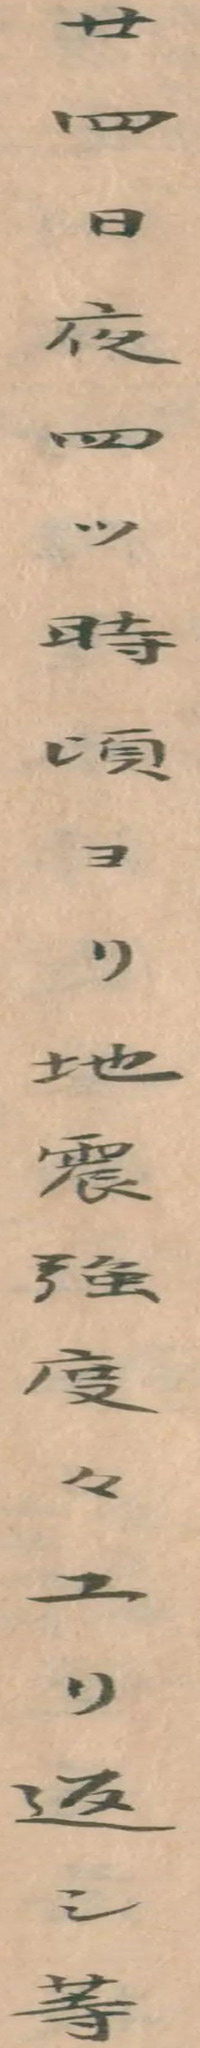廿四日夜四ッ時頃ヨリ地震強度々ユリ返シ等

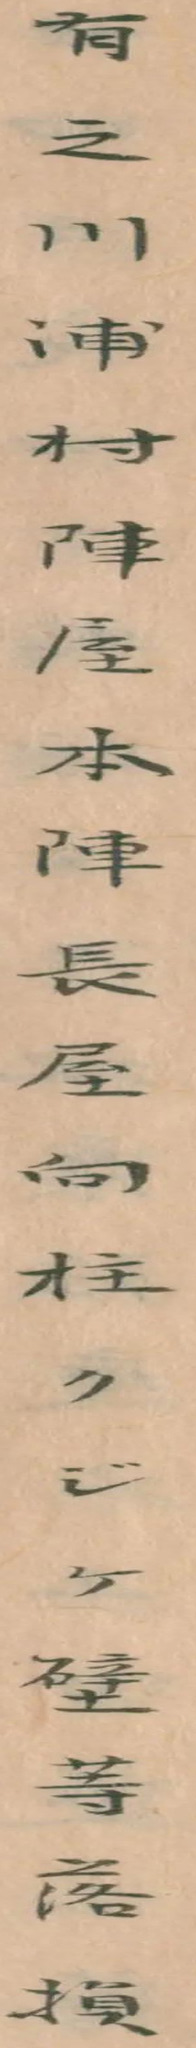有之川浦村陣屋本陣長屋向柱クジケ壁等落損
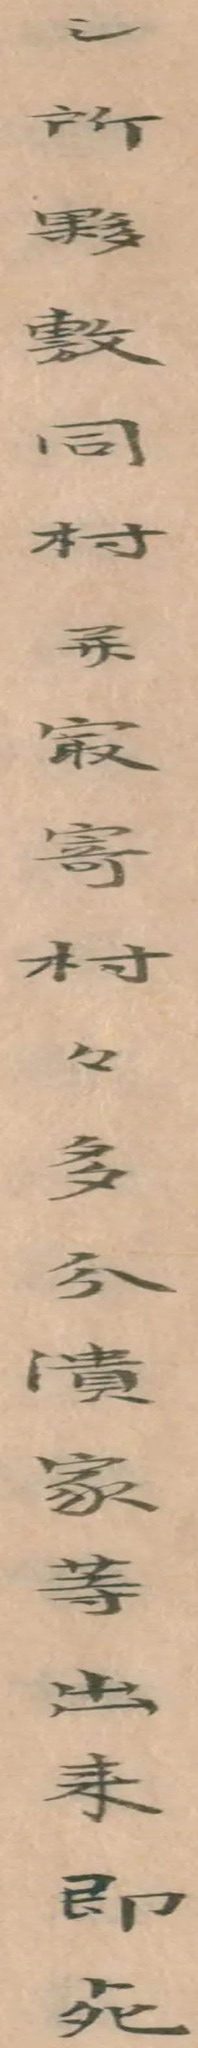シ所夥敷同村并最寄村々多分潰家等出来即死
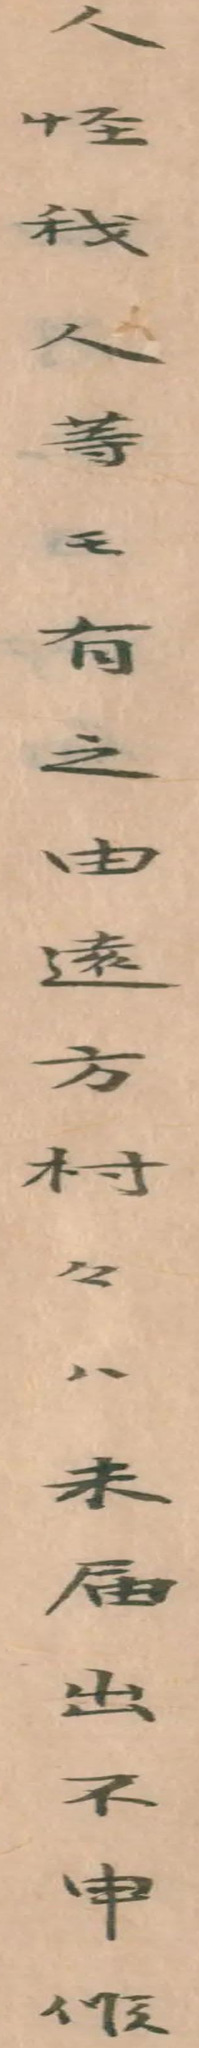人怪我人等モ有之由遠方村々ハ未届出不申候
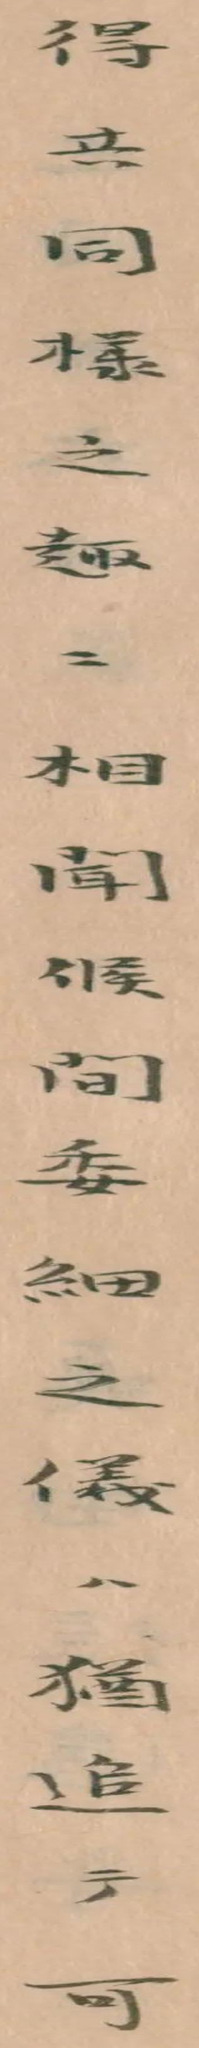得共同様之趣二相聞候間委細之儀ハ猶追テ可
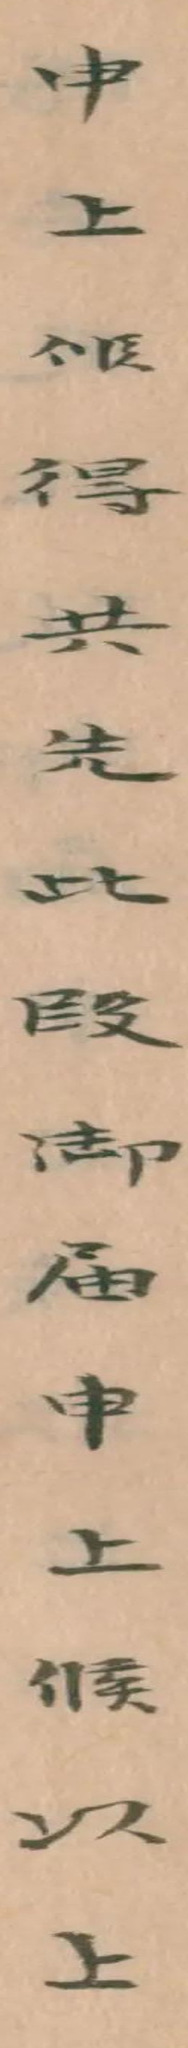申上候得共先此段御届申上候以上
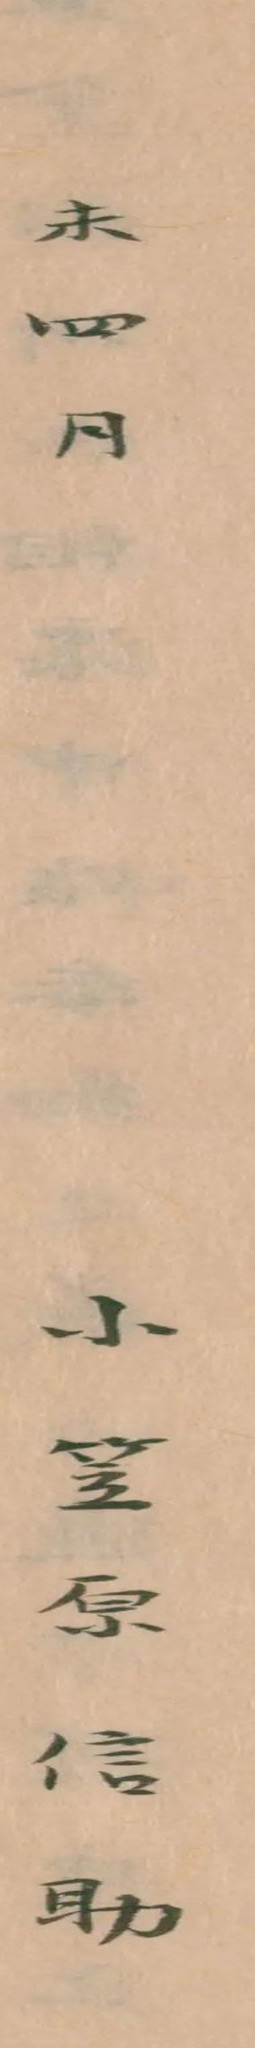未四月小笠原信助
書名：地災撮要. 巻1(噴火山・地震ノ部)
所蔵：国立国会図書館 National Diet Library, JAPAN
